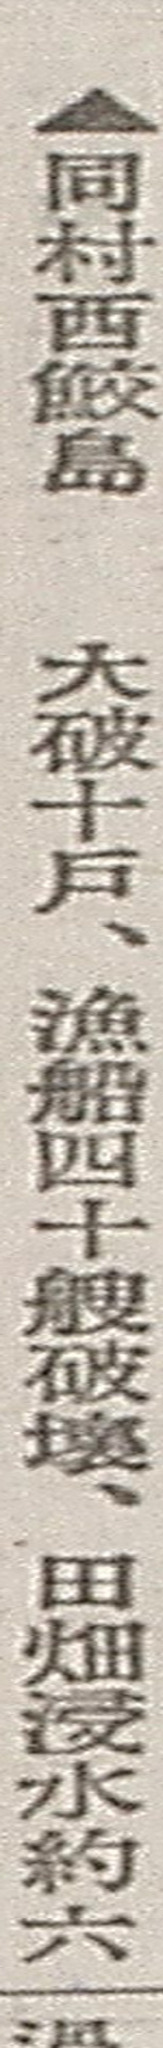▲同村西鮫島大破十戸、漁船四十艘破壊、田畑浸水約六
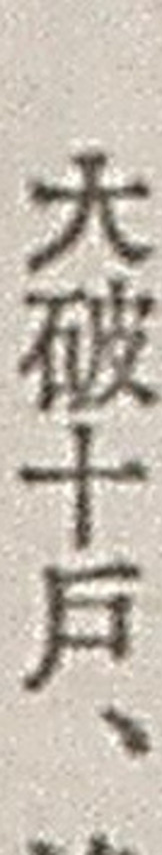大破八戸。
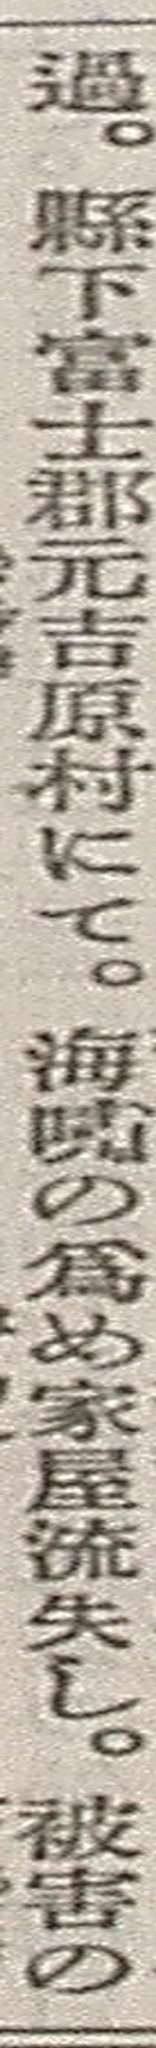過。県下富士郡元吉原村にて。海嘯の為め家屋流失し。被害の
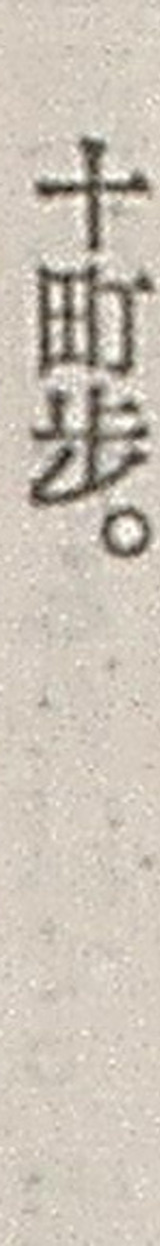十町歩。
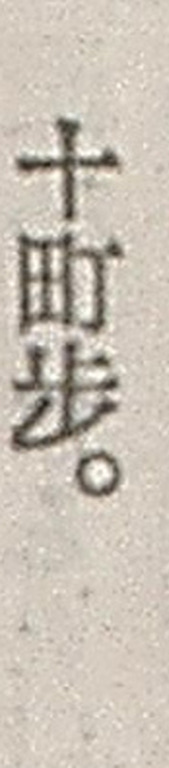十町歩。
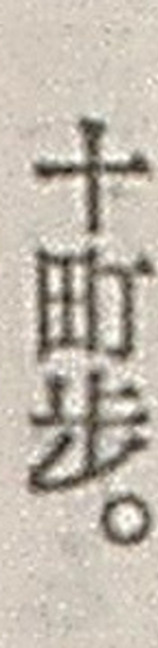十町歩。
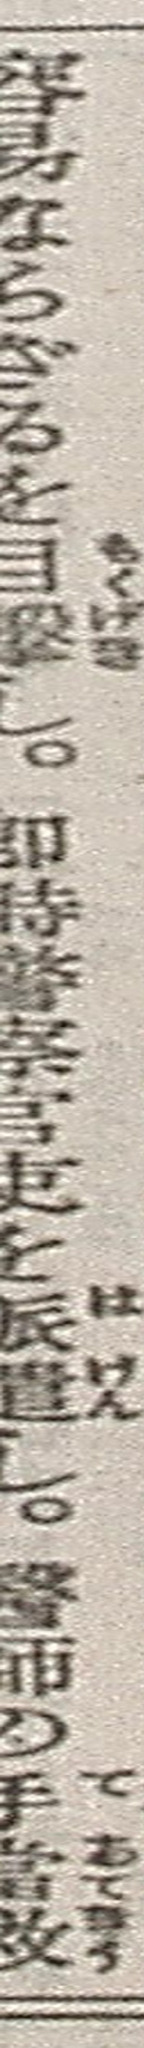容易ならざるを目撃し。即時警察官吏を派遣し。医師の手当救
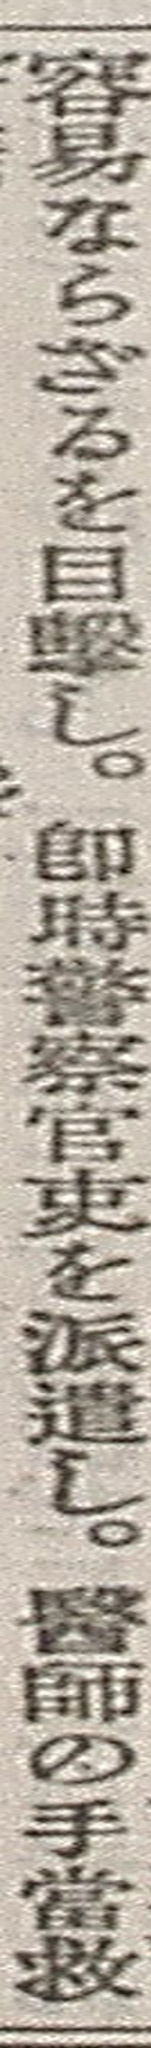容易ならざるを目撃し。即時警察官吏を派遣し。医師の手当救
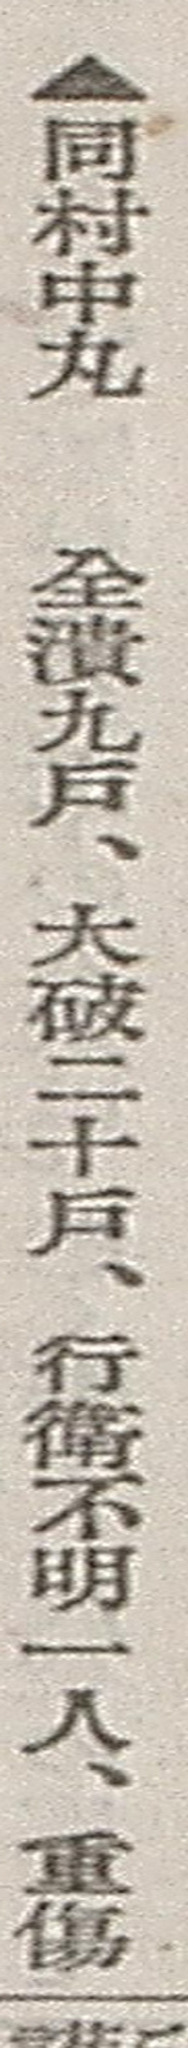▲同村中丸全潰九戸、大破二十戸、行衛不明一人、重傷
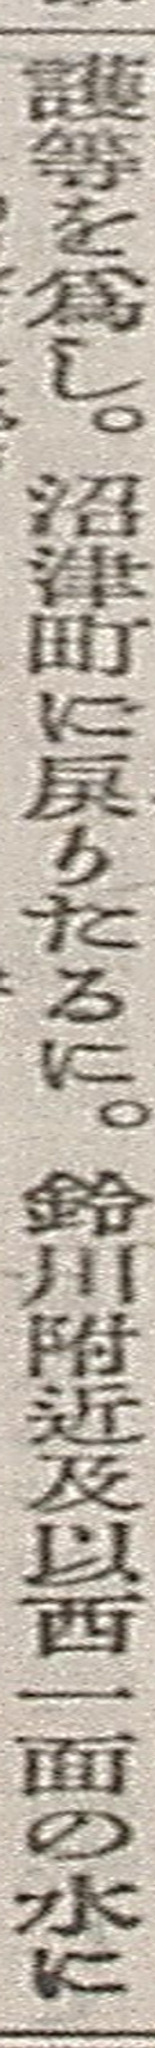護等を為し。沼津町に戻りたるに。鈴川附近及以西一面の水に
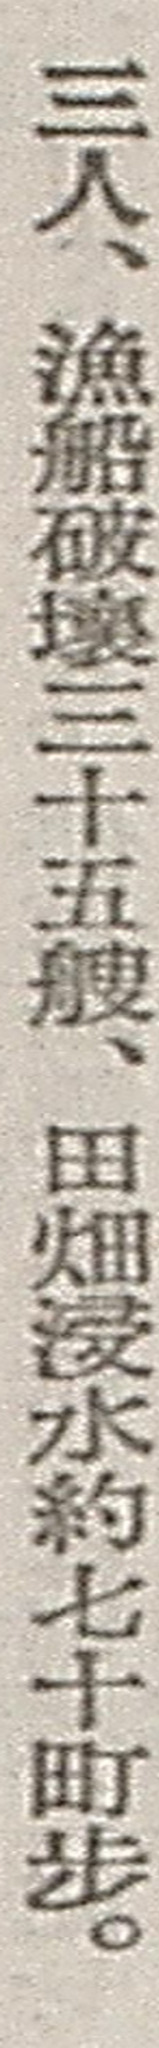三人、漁船破壊三十五艘、田畑浸水約七十町歩。
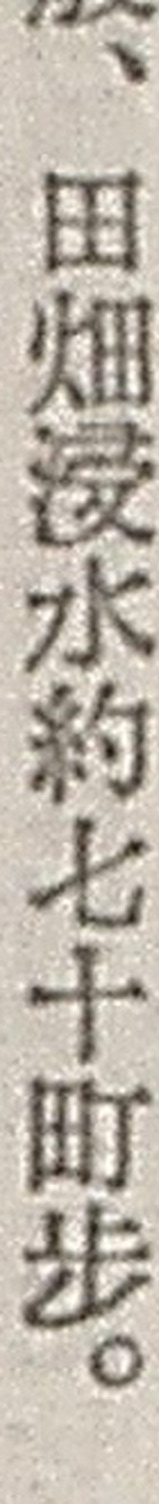田畑浸水約八十町歩。
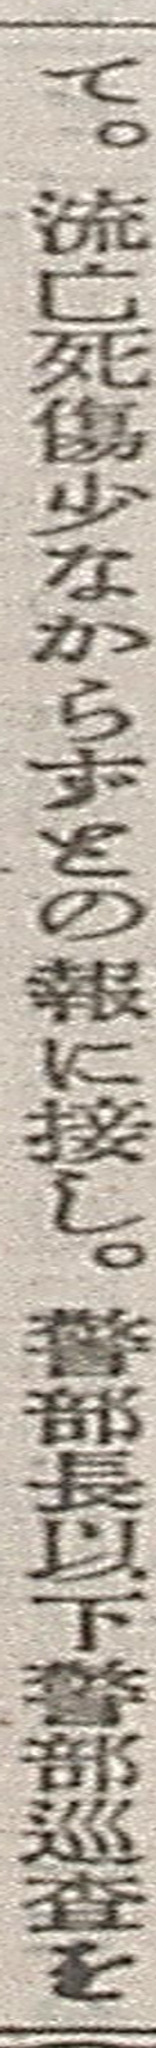て。流亡死傷少なからずとの報に接し。警部長以下警部巡査を
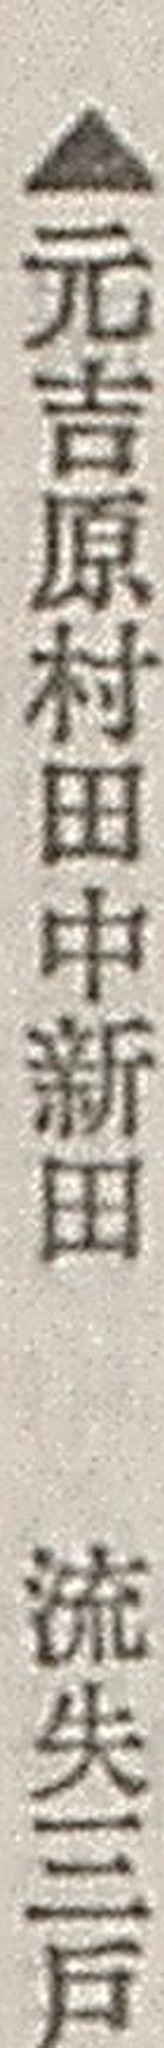▲元吉原村田中新田流失三戸。
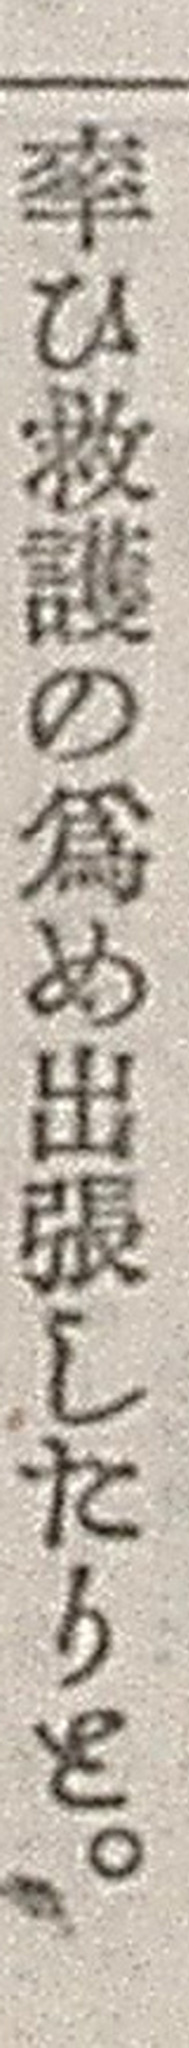率ひ救護の為め出張したりと。
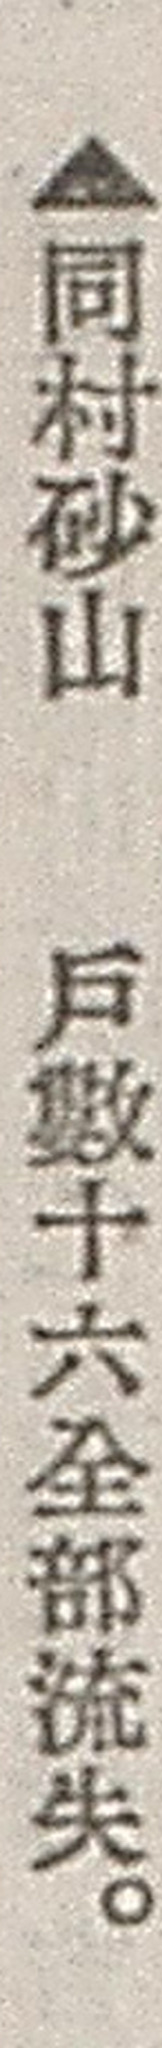▲同村砂山戸数十六全部流失。
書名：風俗畫報臨時増刊第百九十九號　明治三十二年十月各地災害圖會（前編之續）
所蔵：東京大学地震研究所図書室 Earthquake Research Institute Library, The University of Tokyo, JAPAN
